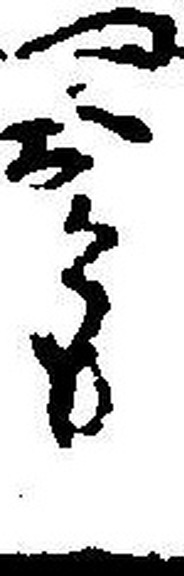おとも
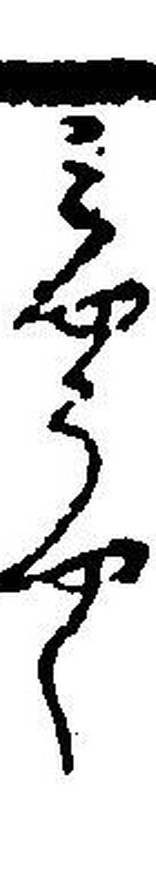みやうやく
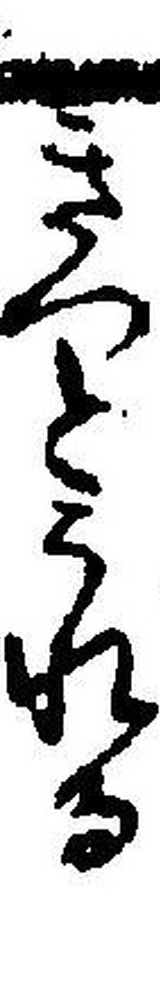きつとうれる
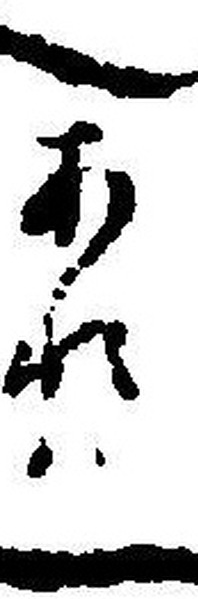あれは
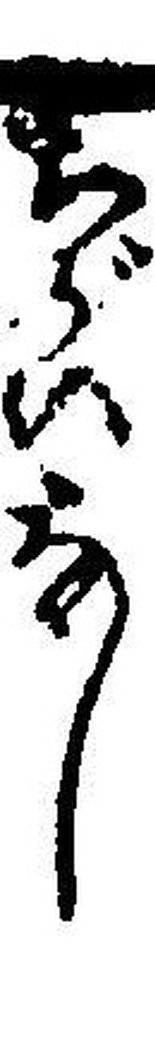ちがいなし
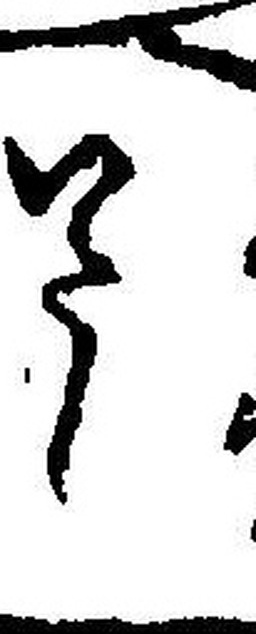いたし
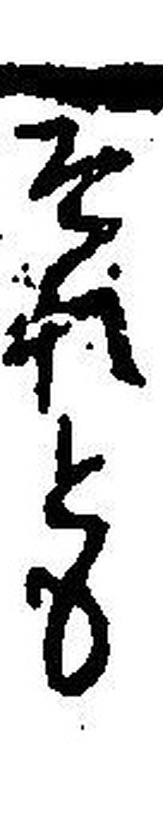それとも
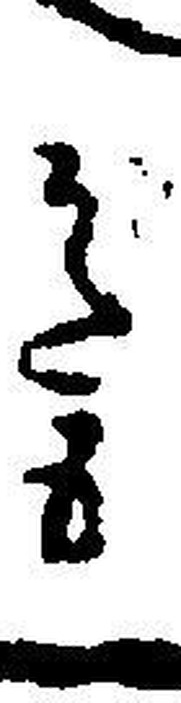かたも
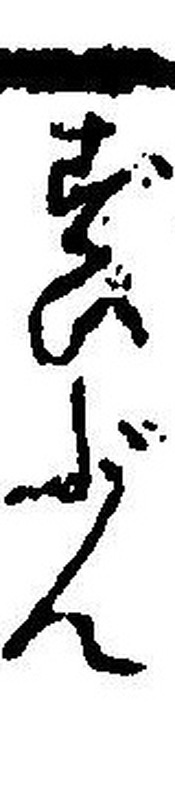ずいぶん
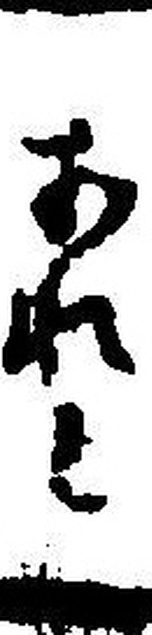あれと
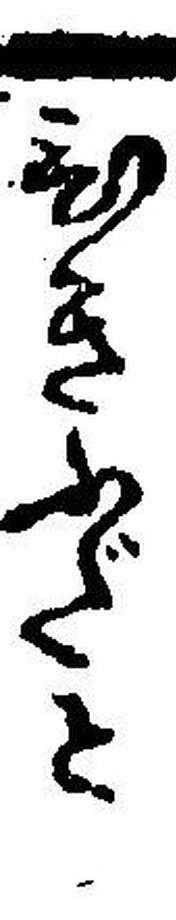ひきふだと
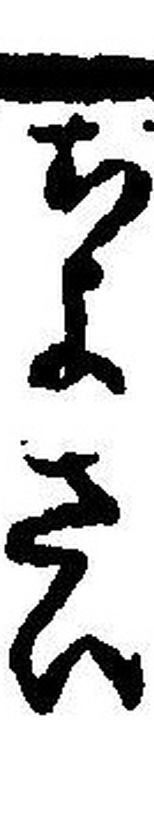ぢよさい
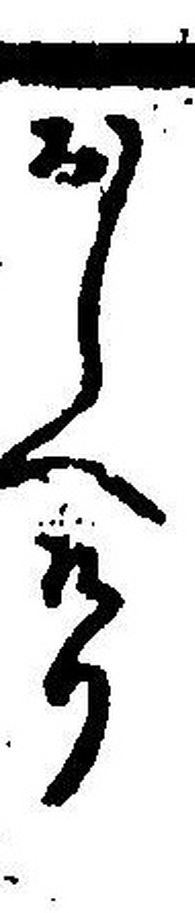おしへけり

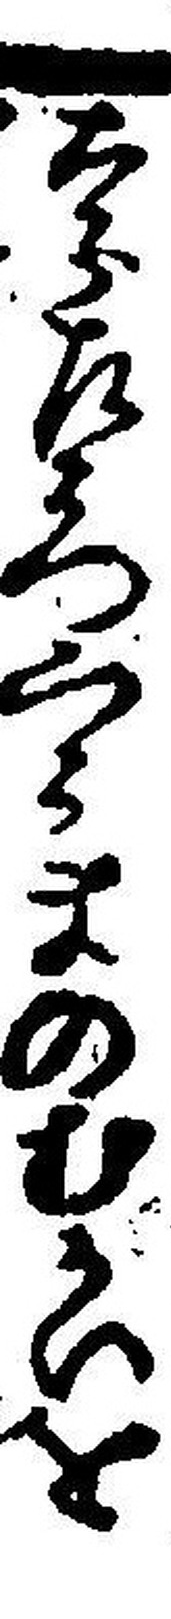太郎左衛門くらまのむかいを
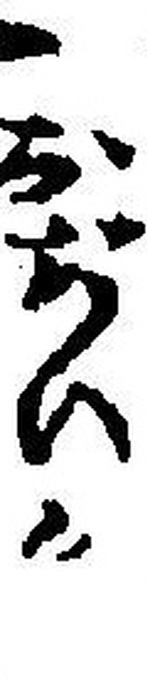おぢいか
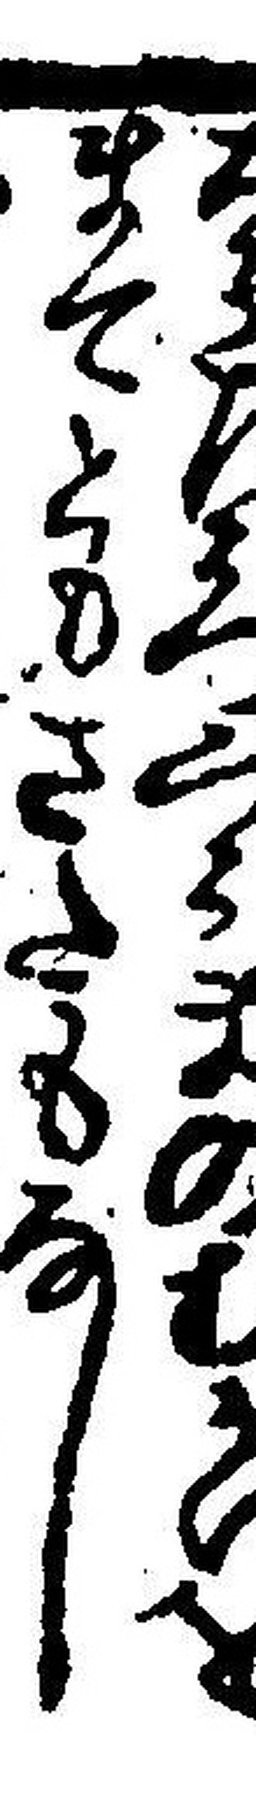まてともさたもなし
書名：牡丹餅棚有 / 市場通笑作
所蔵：東京大学総合図書館 General Library in the University of Tokyo, JAPAN
